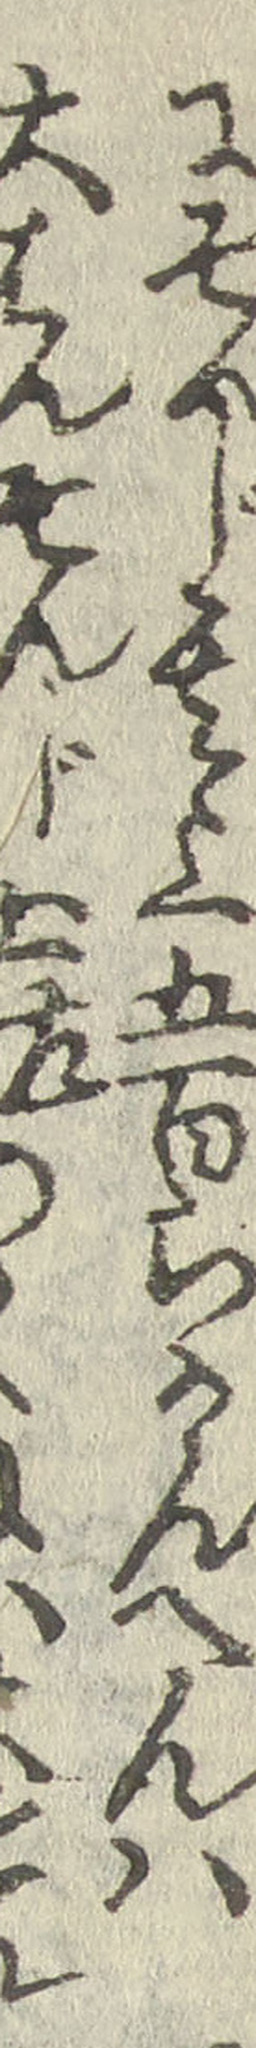大はんそんじ土佐のくには大そん
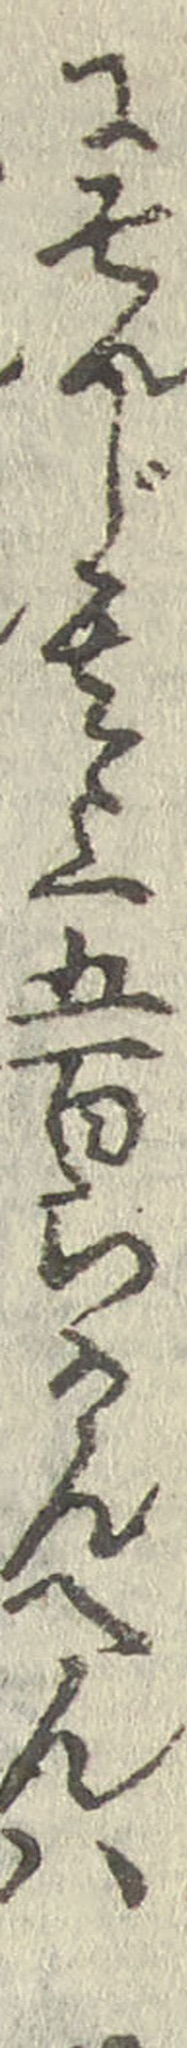にそんじ其上五百らかんへんは
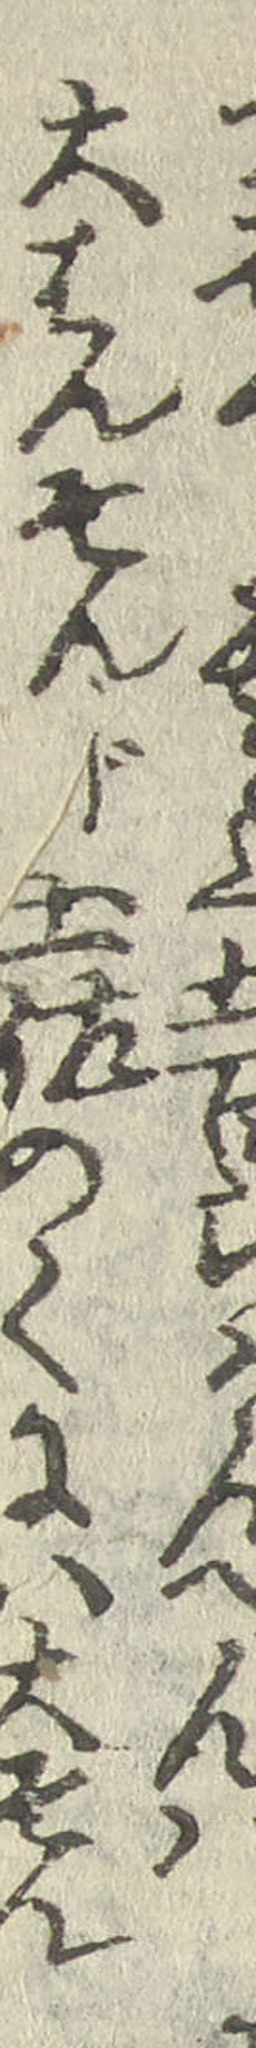大はんそんじ土佐のくには大そん
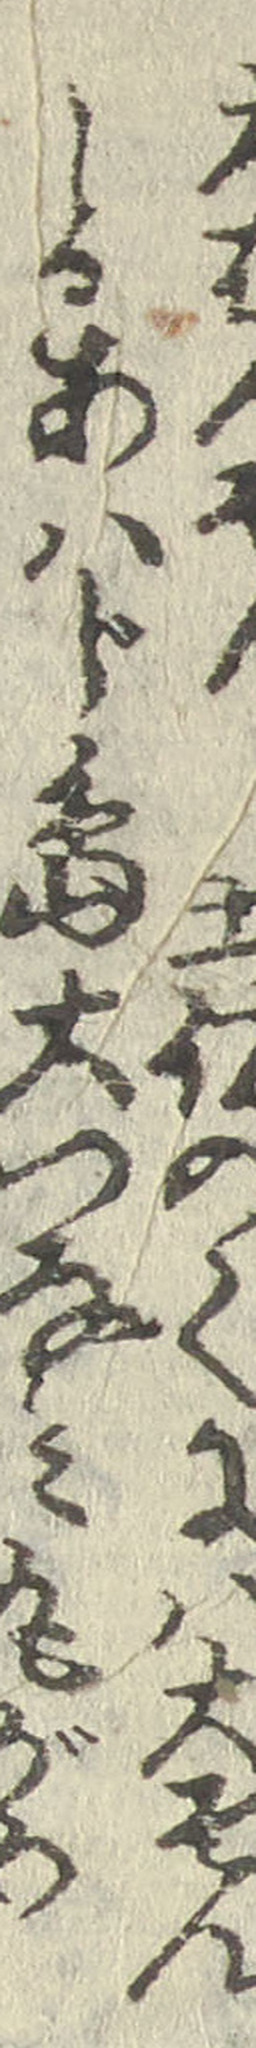しるあはじ嶋大つなみ丸がめ
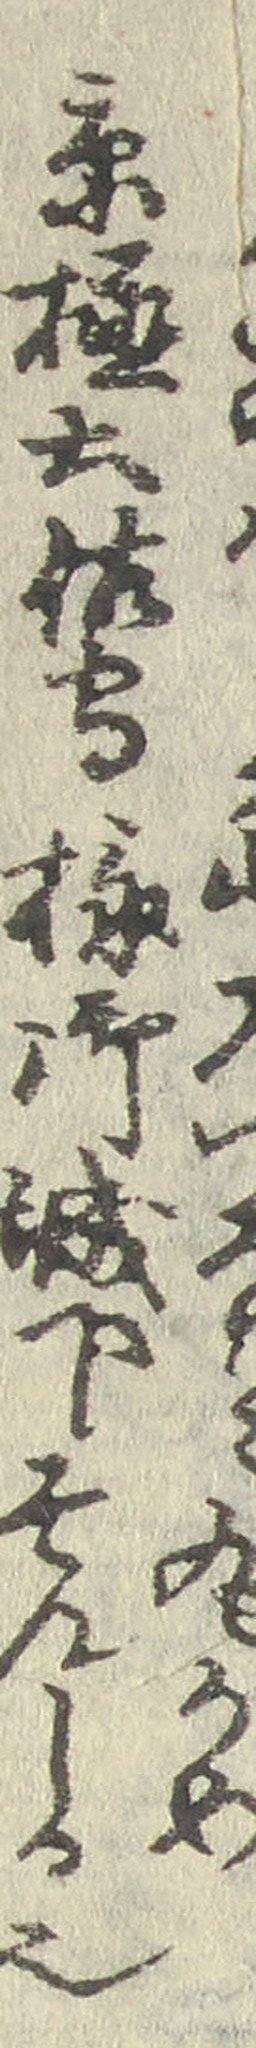京極土佐守様御城下そんしる也
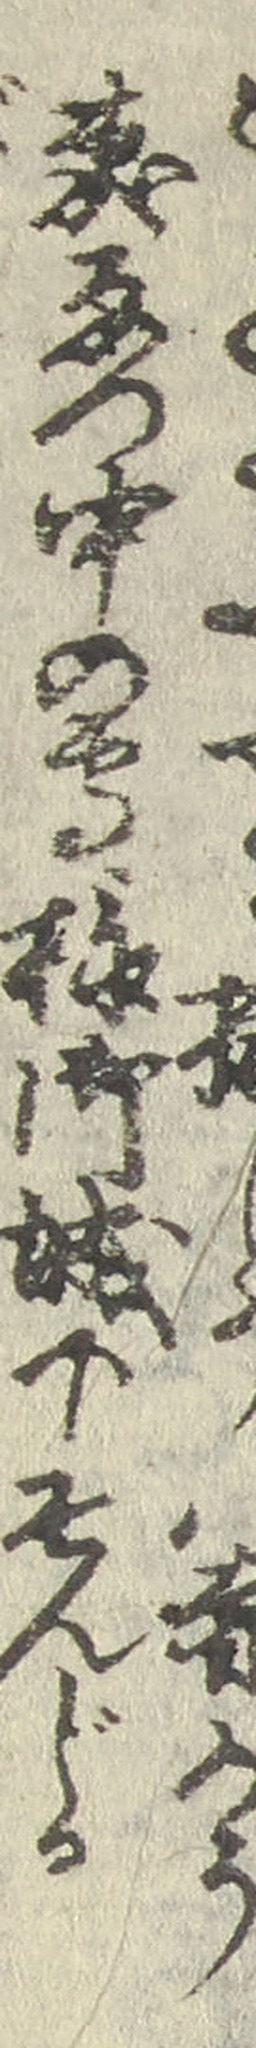森ゑつ中の守様御城下そんじる
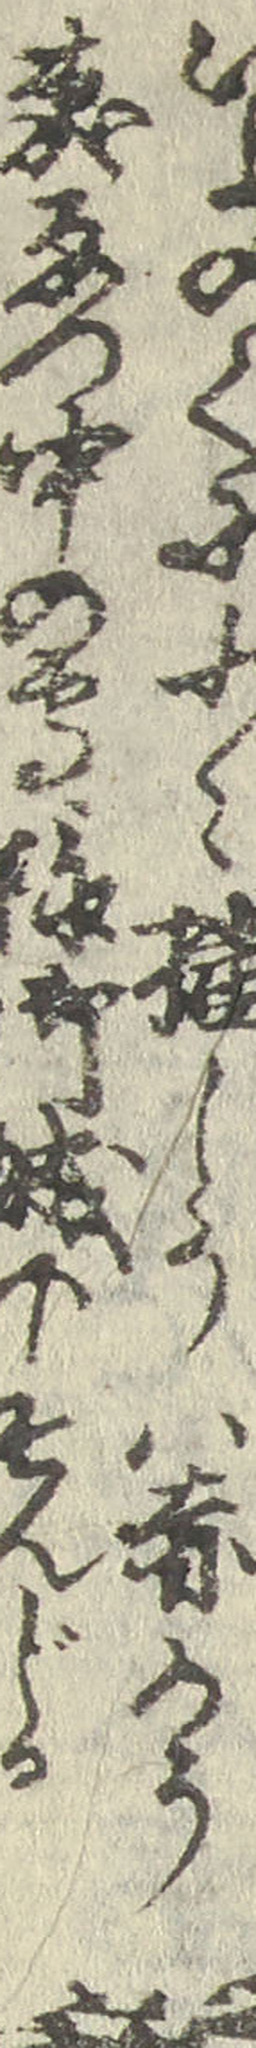森ゑつ中の守様御城下そんじる
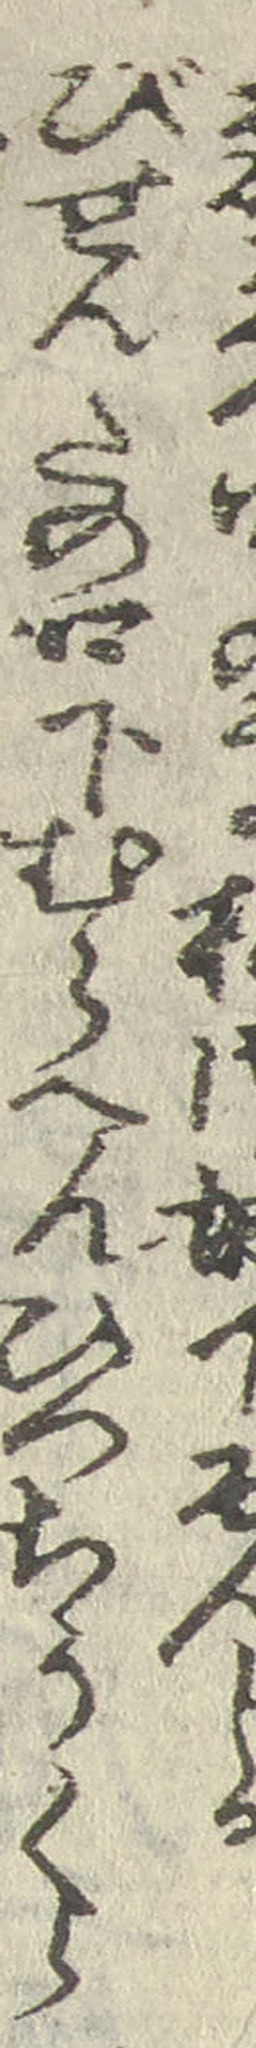びぜんたの口下むらへんひつちうくら
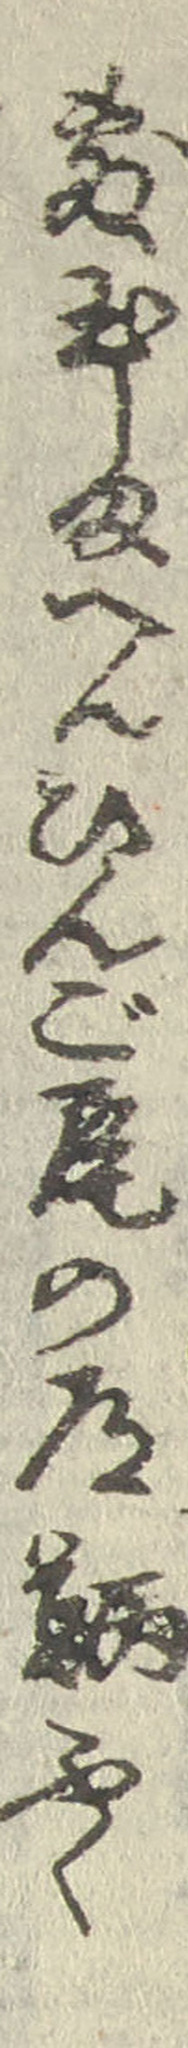敷玉しまへんひんご尾の道鞆ふく
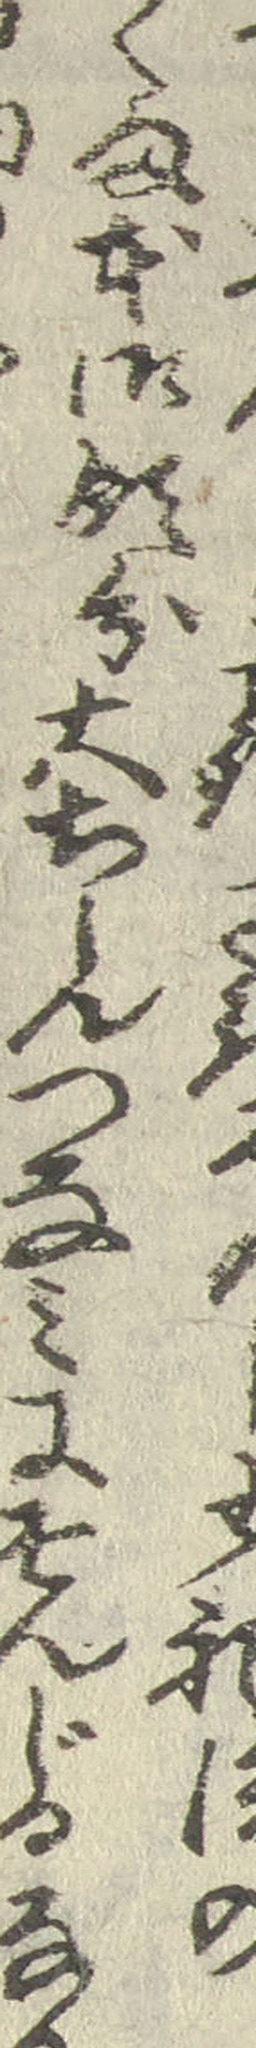くま本御領分大ちしんつなみにそんじるなり
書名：諸国大地震
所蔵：東京大学総合図書館 General Library in the University of Tokyo, JAPAN
